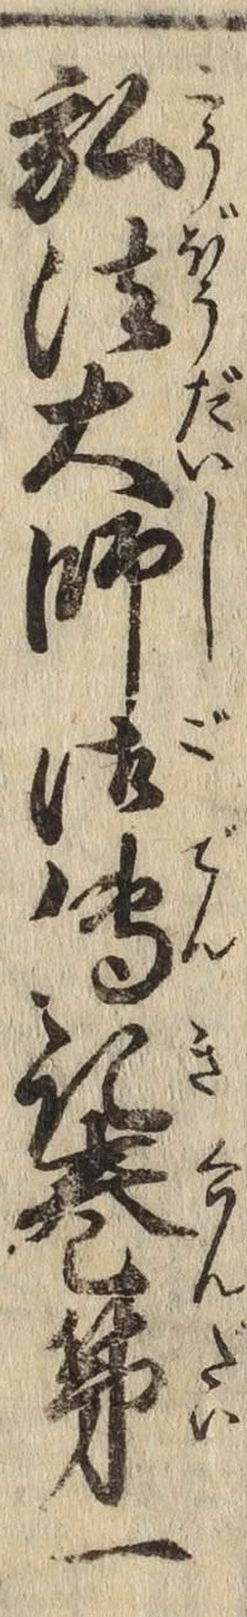弘法大師御伝記巻第一
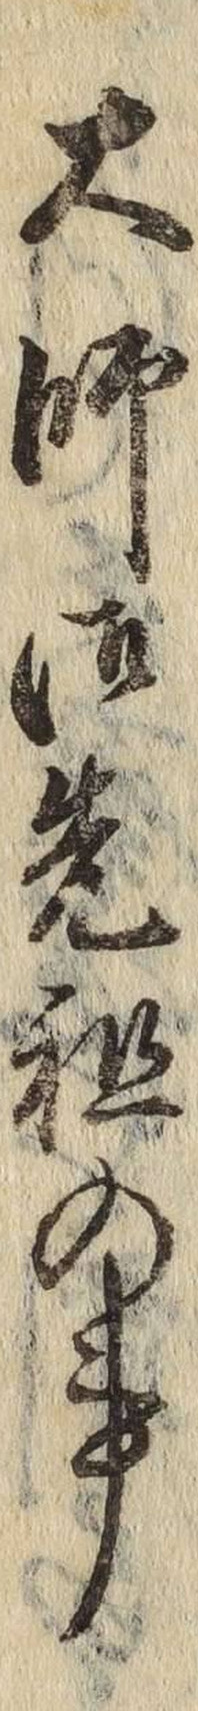大師御先祖の事
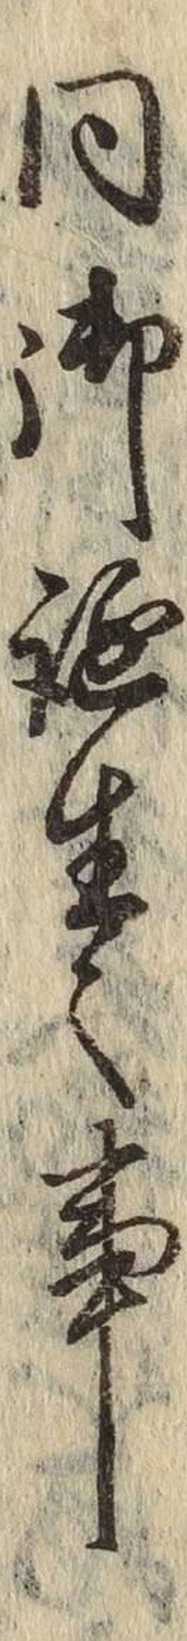同御誕生の事
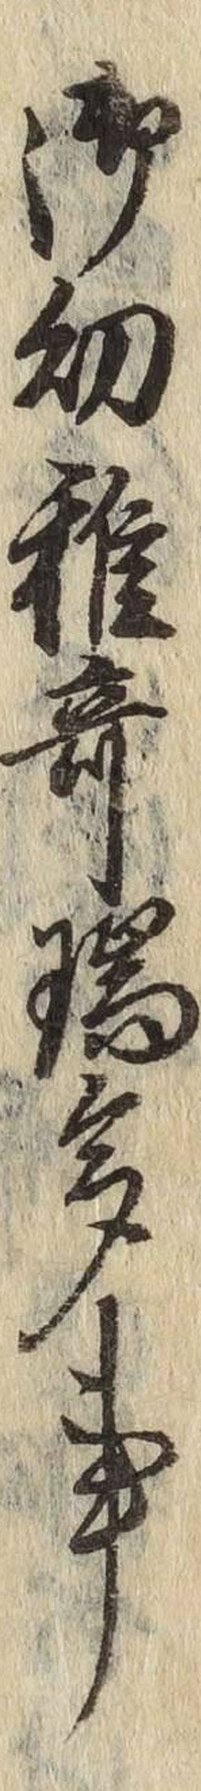御幼稚奇瑞多事
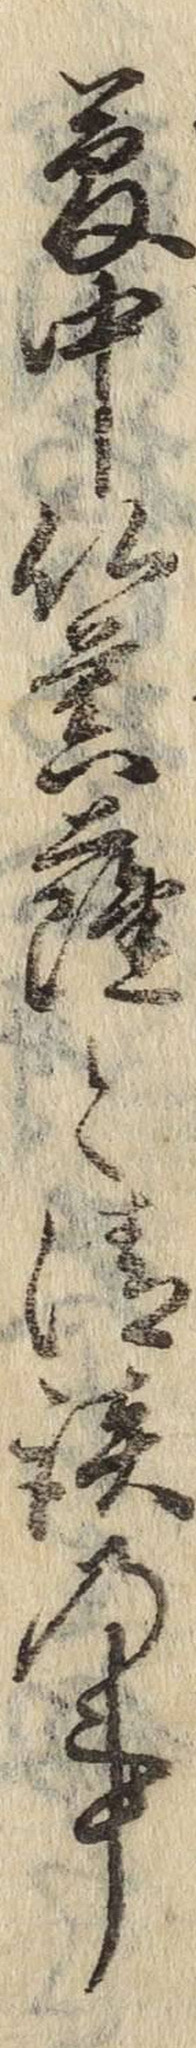夢中仏菩薩と清談の事
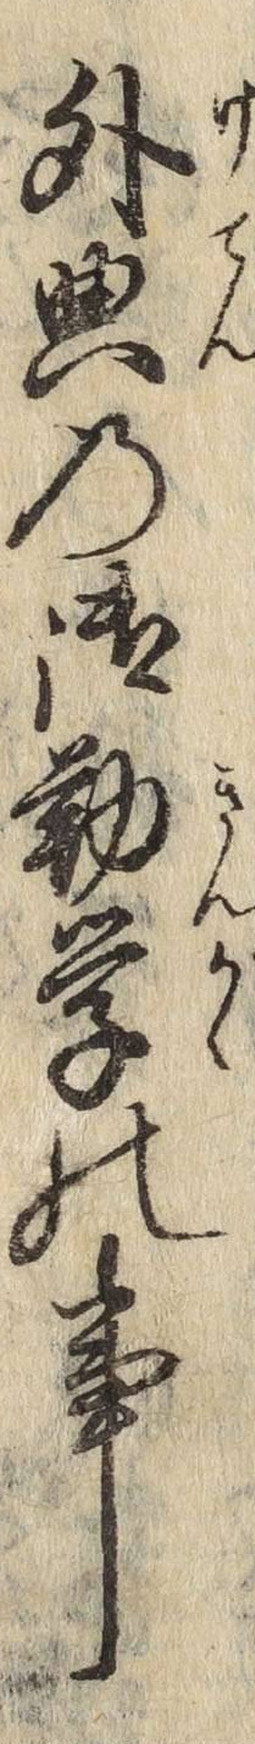外典の御勤学の事

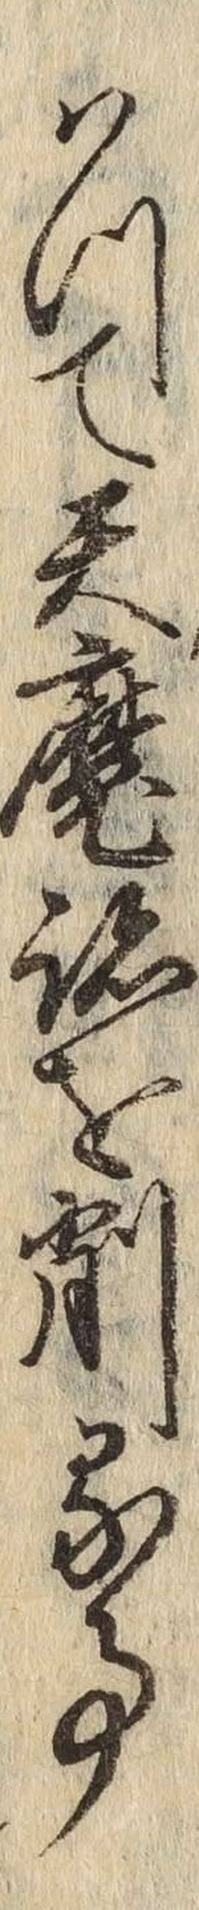わつて天魔跡を削る事
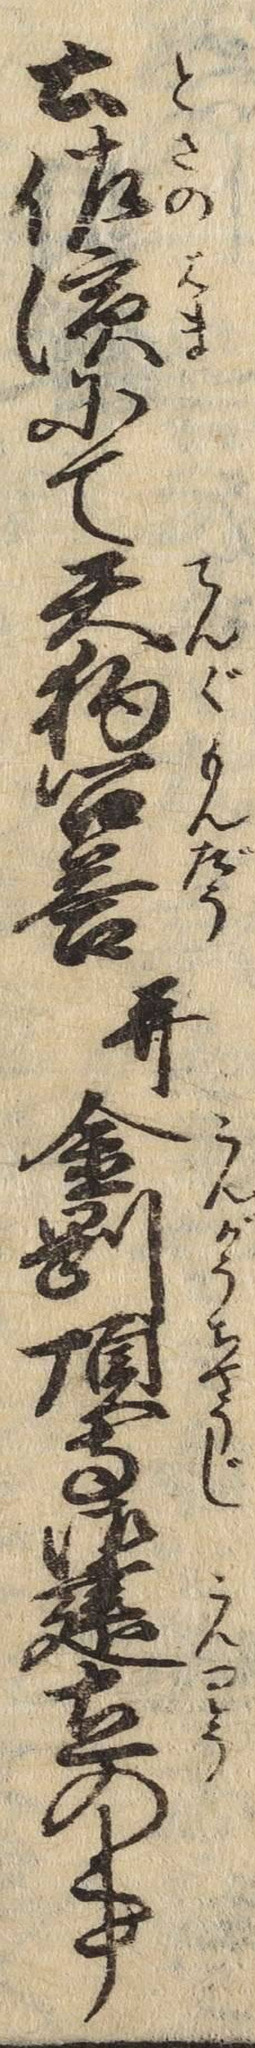土佐浜にて天狗問答并金剛頂寺御建立の事
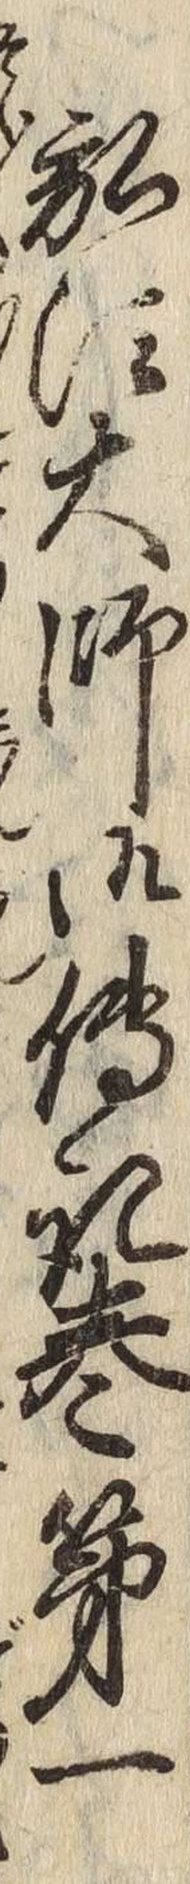弘法大師御伝記巻第一
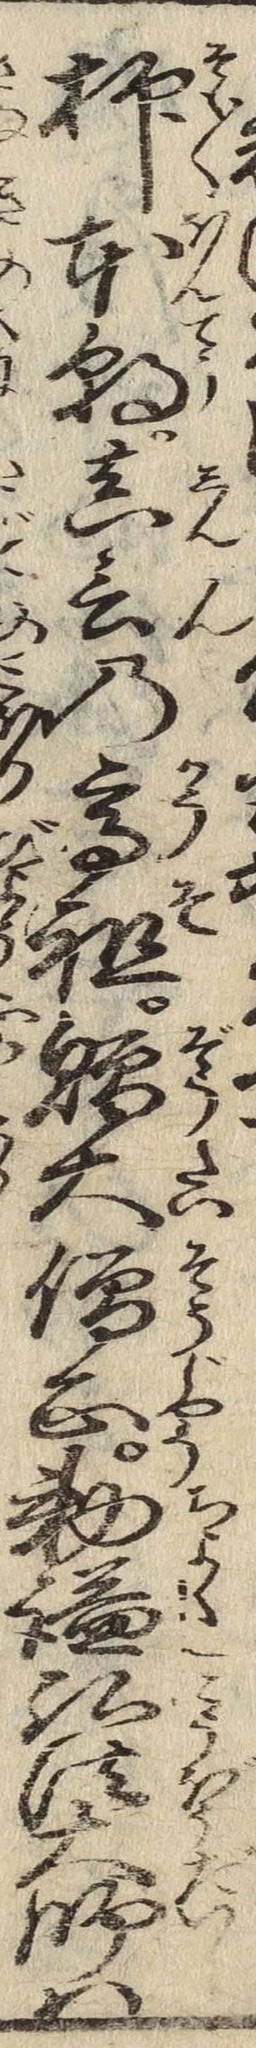抑本朝真言の高祖。贈大僧正。勅謚弘法大師は
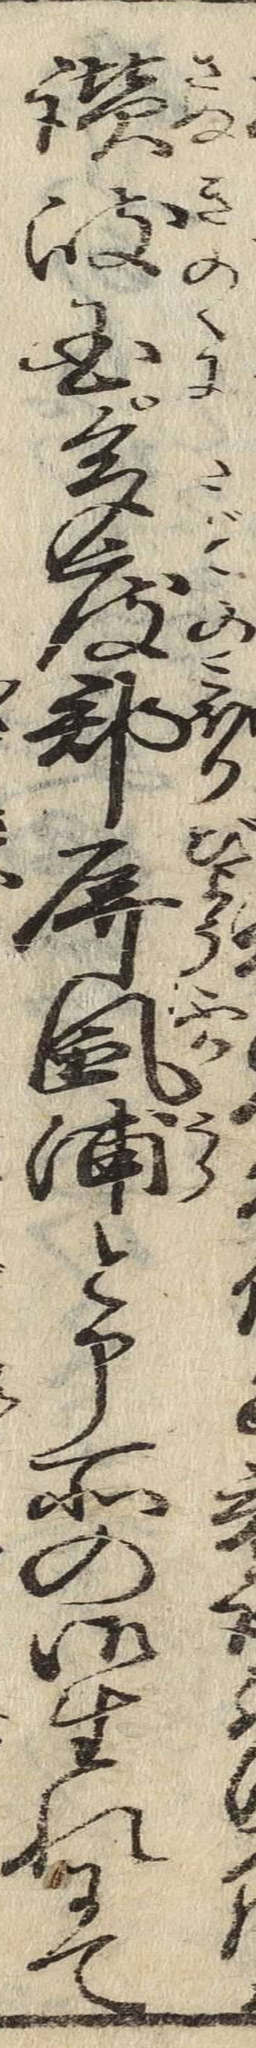讃岐国。多度郡屏風浦と申所の御生れにて
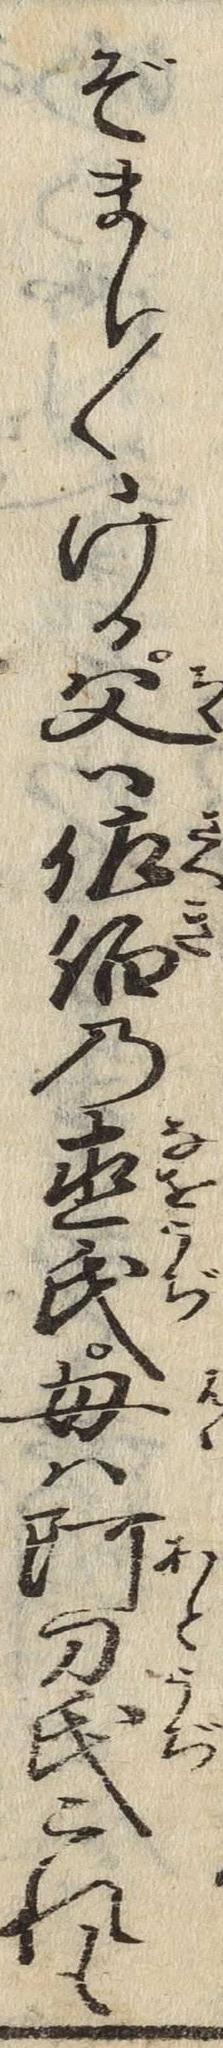ぞまし〳〵ける。父は佐伯の直氏。母は阿刀氏これも
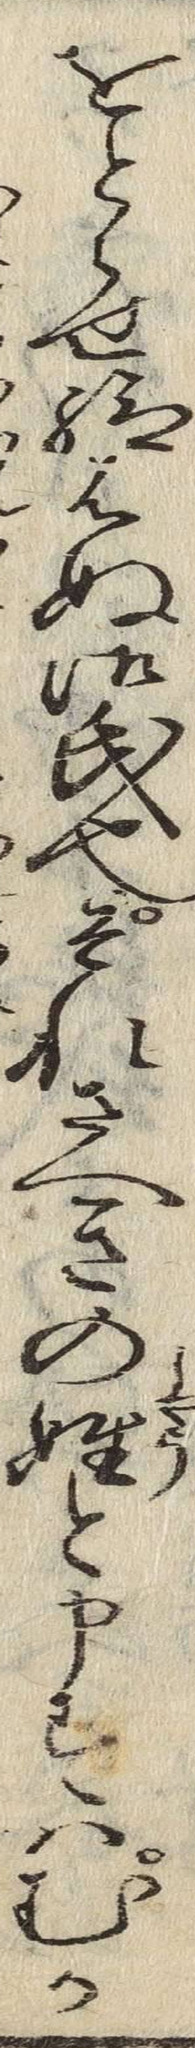をとらせ給はぬ御氏也。それさへきの姓と申すは。むか
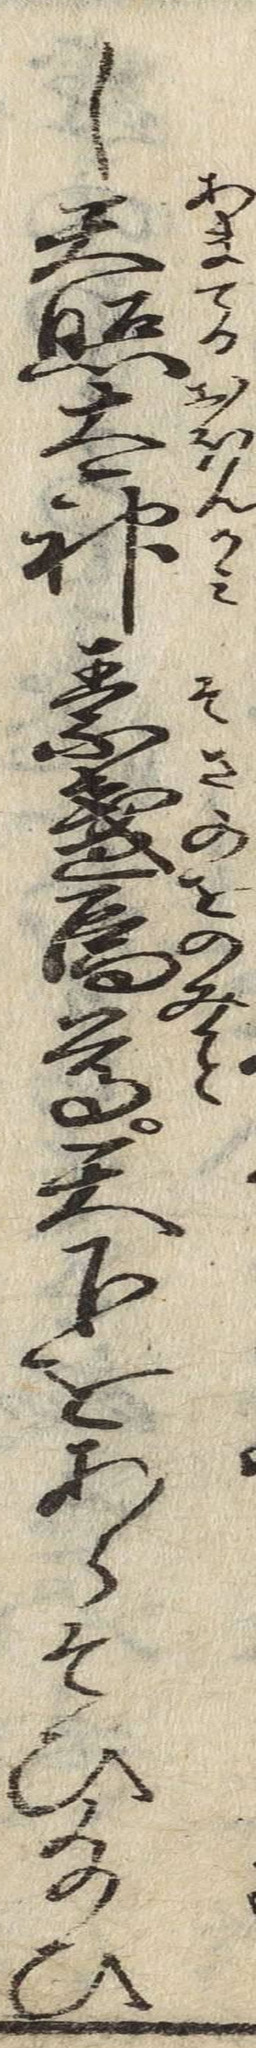し天照太神素盞烏尊。天下をあらそひ給ひ
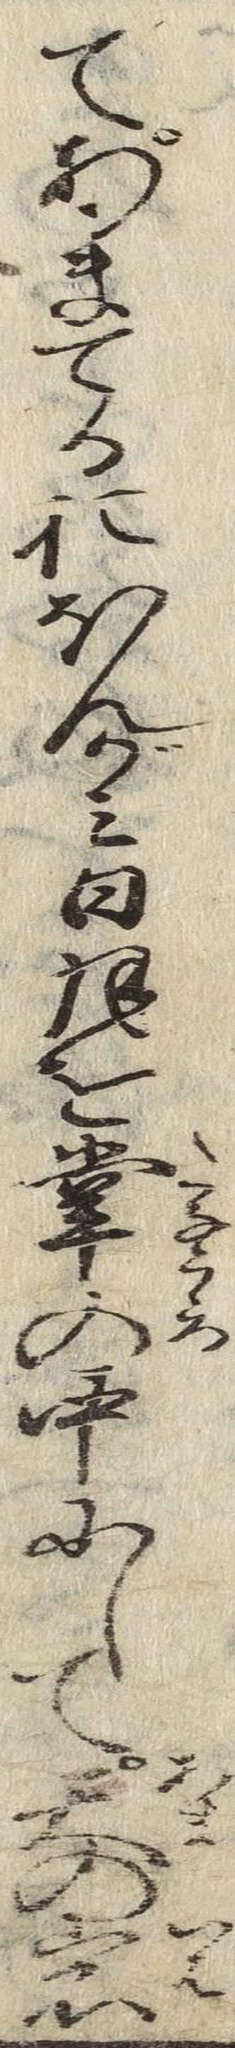て。あまてるおほんがみ日月を掌の中にして。天の岩
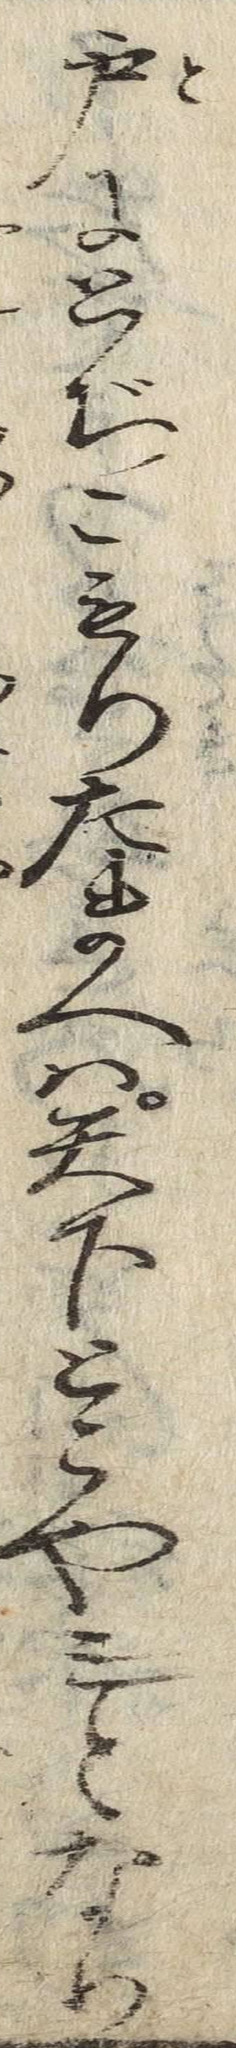戸にとぢこもりたまへは。天下とこやみとなり
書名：弘法大師御傳記
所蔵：京都府立京都学・歴彩館 国文学研究資料館
